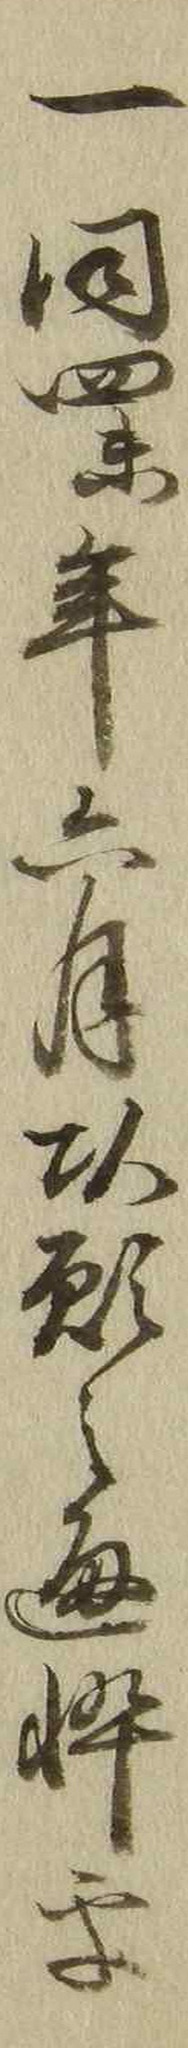一同四未年六月頭願之通忰平
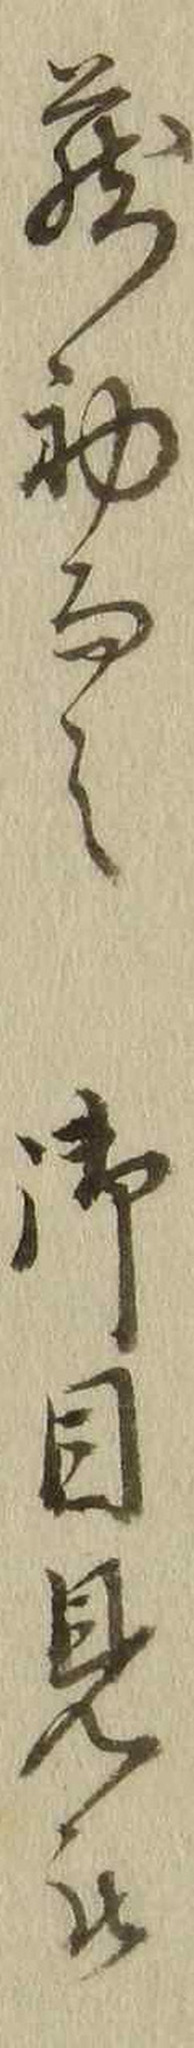藏初而之御目見被
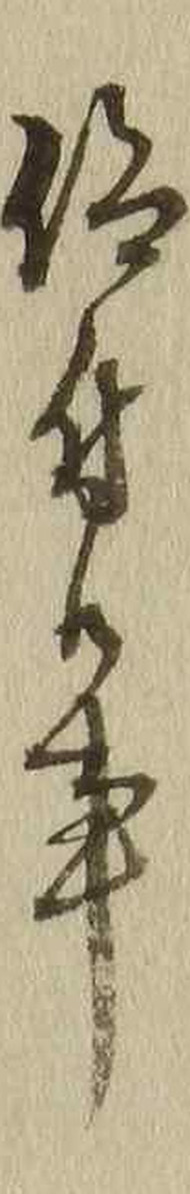仰付候事
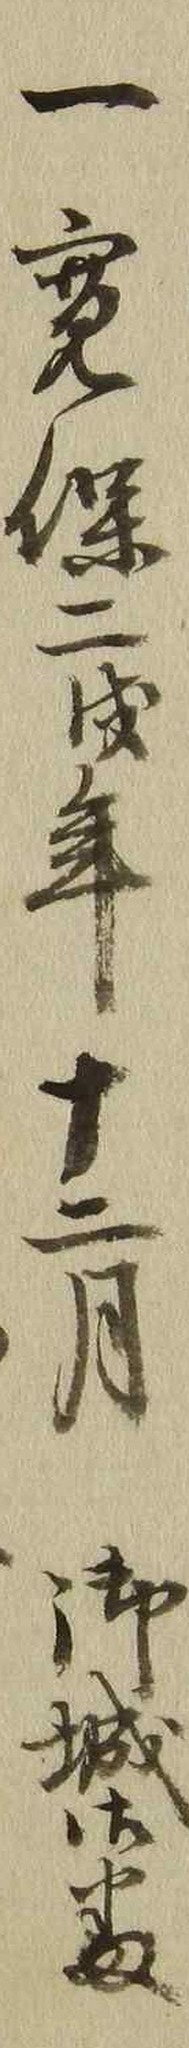一寛保ニ戌年十二月御城御番
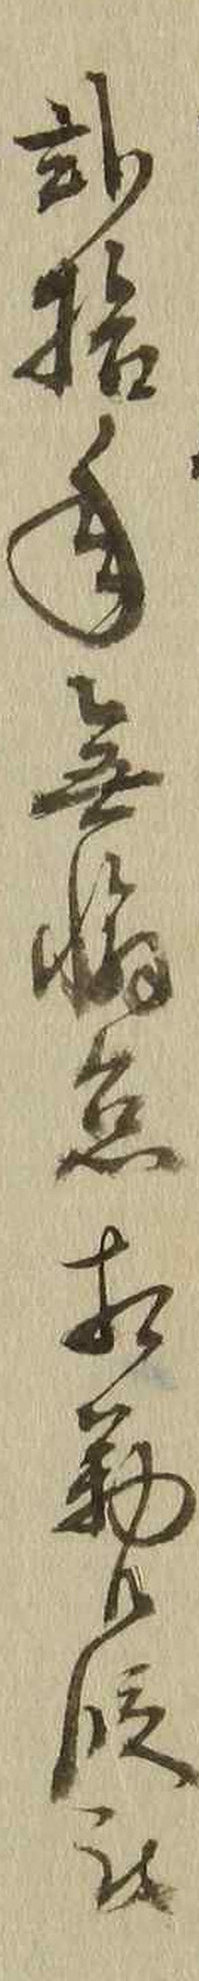弐拾年無愉怠相勤候段被
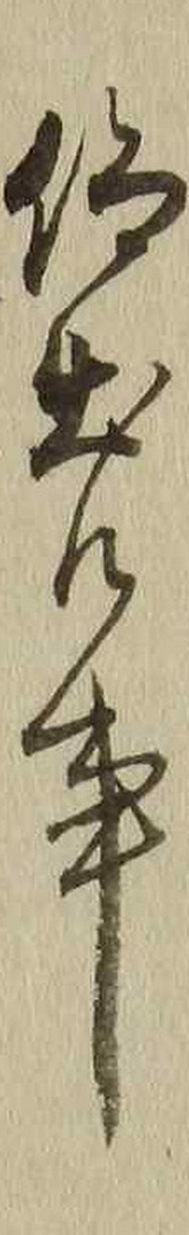仰出候事
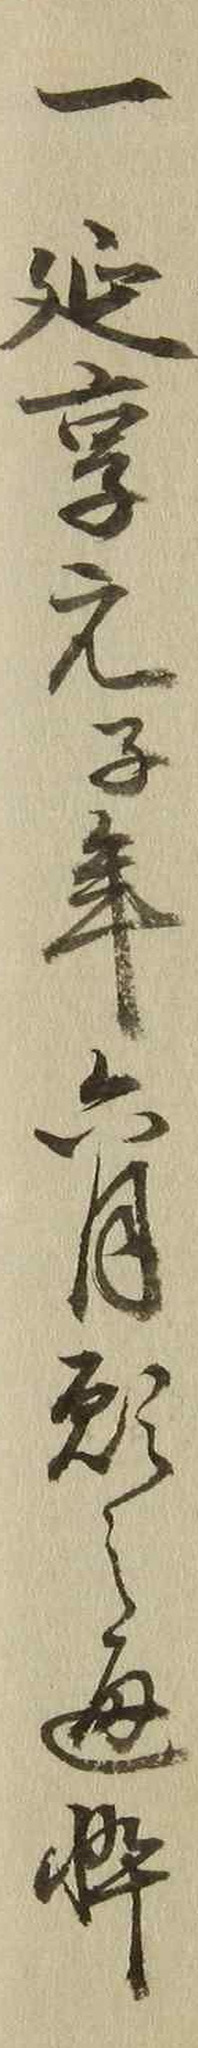一延享元子年六月願之通忰
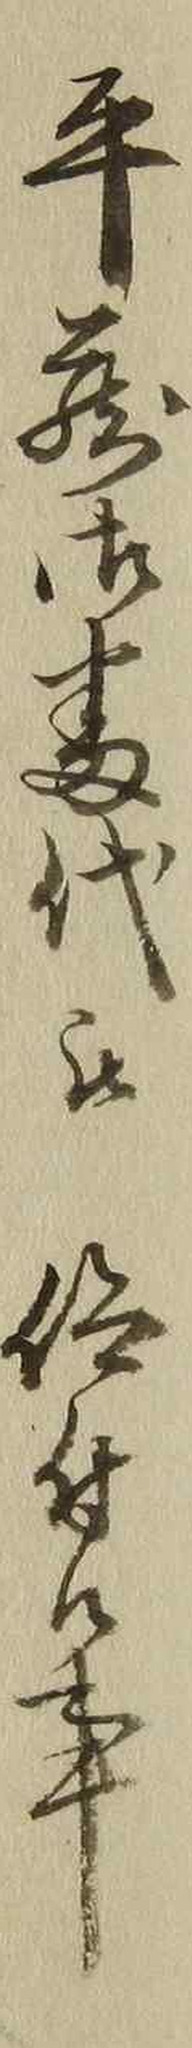平蔵御番代被仰付候事
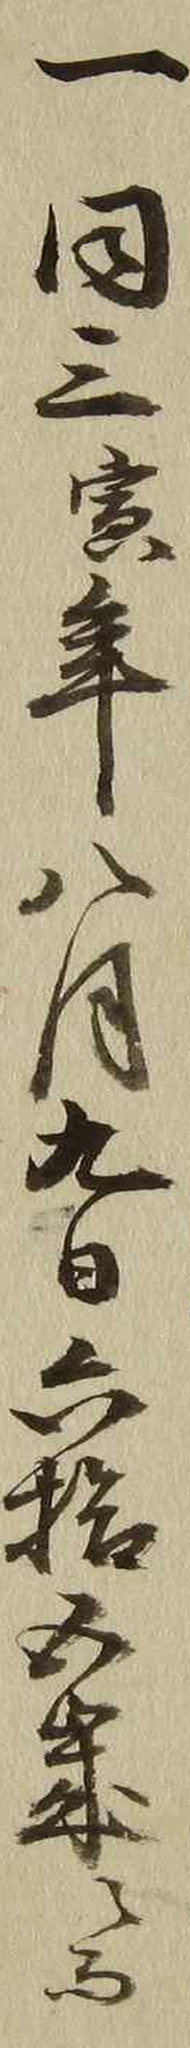一同三寅年八月九日六拾五歳ニ而
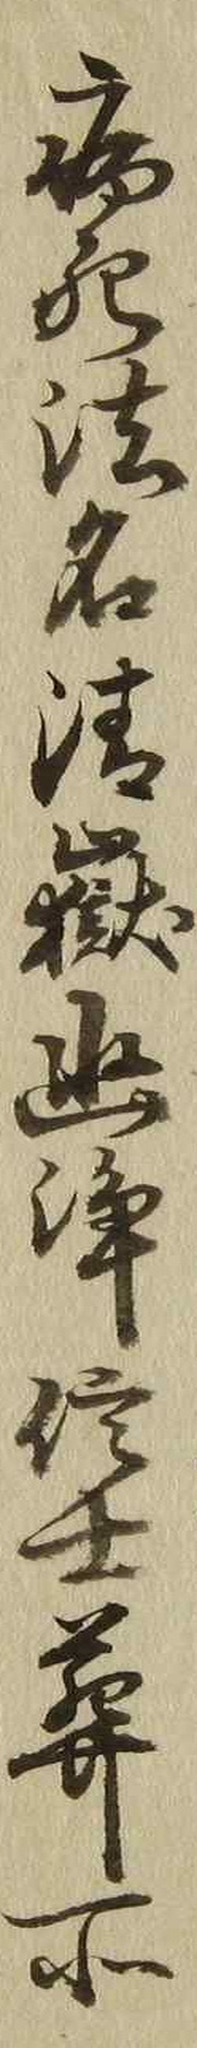病死法名清嶽幽浄信士葬所
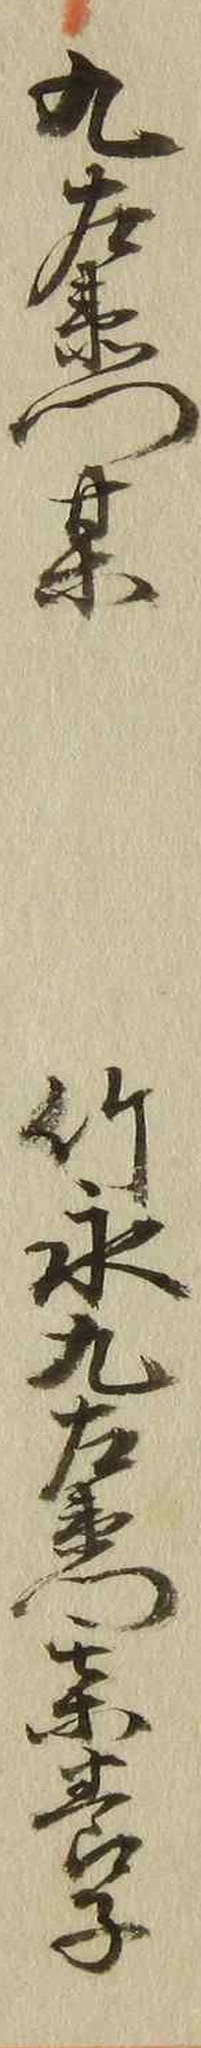久左衛門某竹中久左衛門某養子
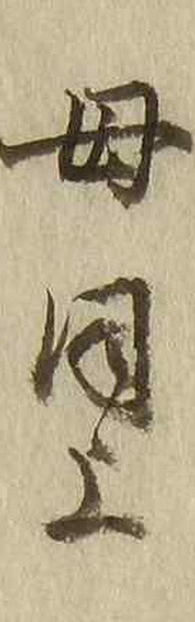母同上
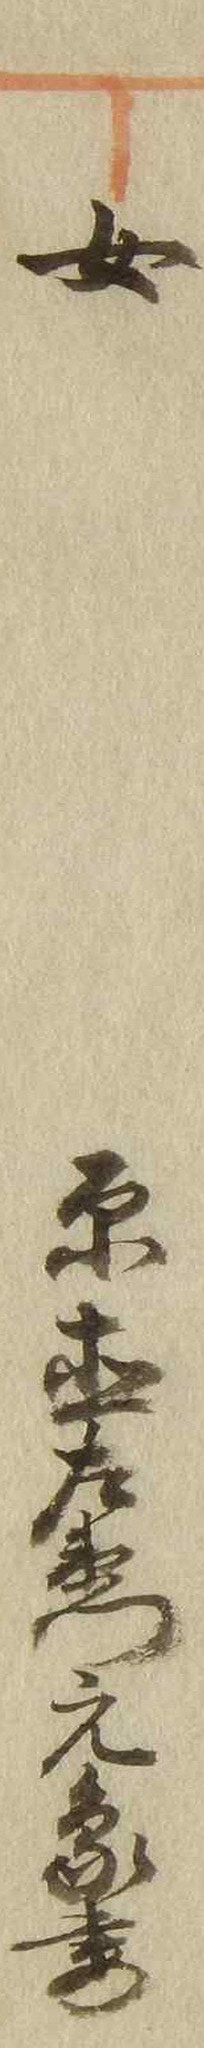女原直左衛門元少象妻

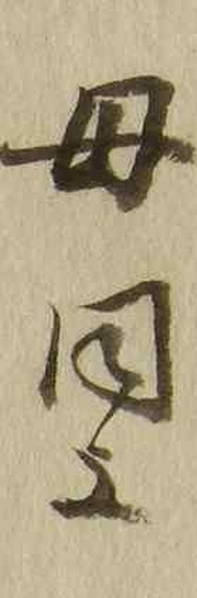母同上
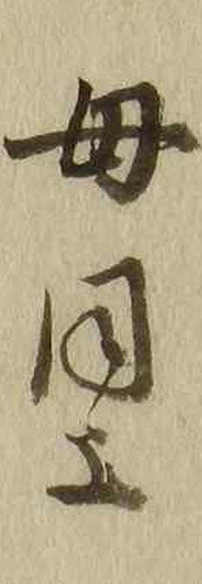母同上
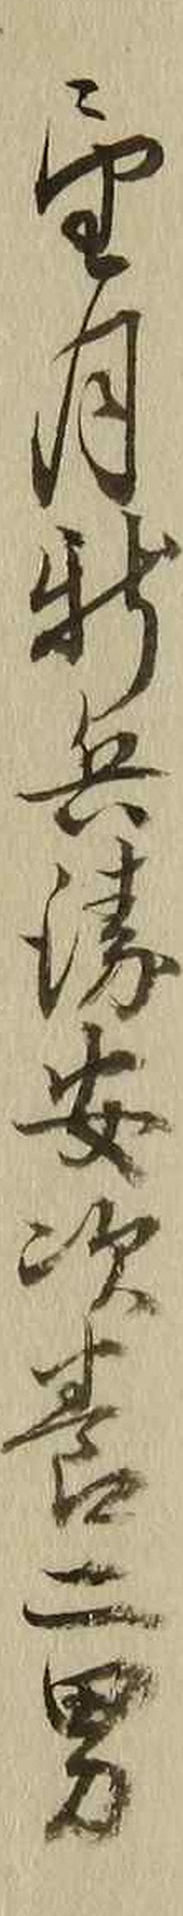望月新兵衛兵勝次養二男
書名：諸士系譜　巻之64　と之部7
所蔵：会津若松市立会津図書館
